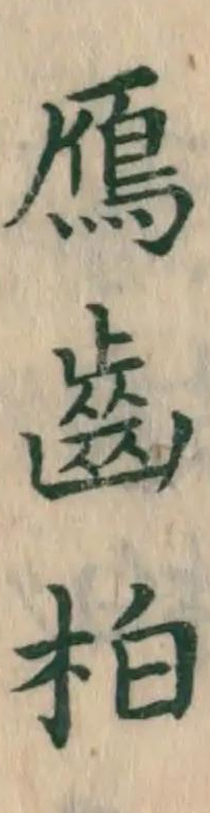鴈歯柏

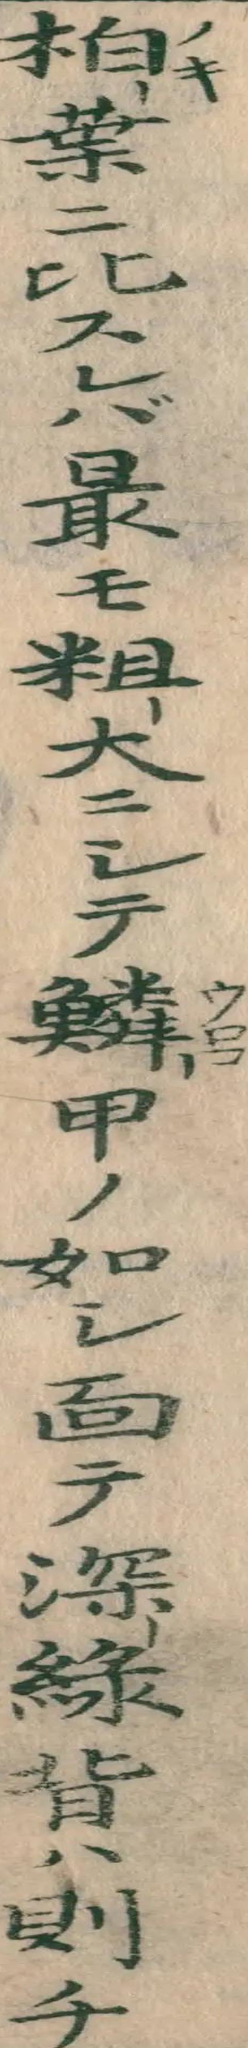柏-葉ニ比スレバ最モ粗-大ニシテ鱗-甲ノ如シ面テ深-緑背ハ則チ
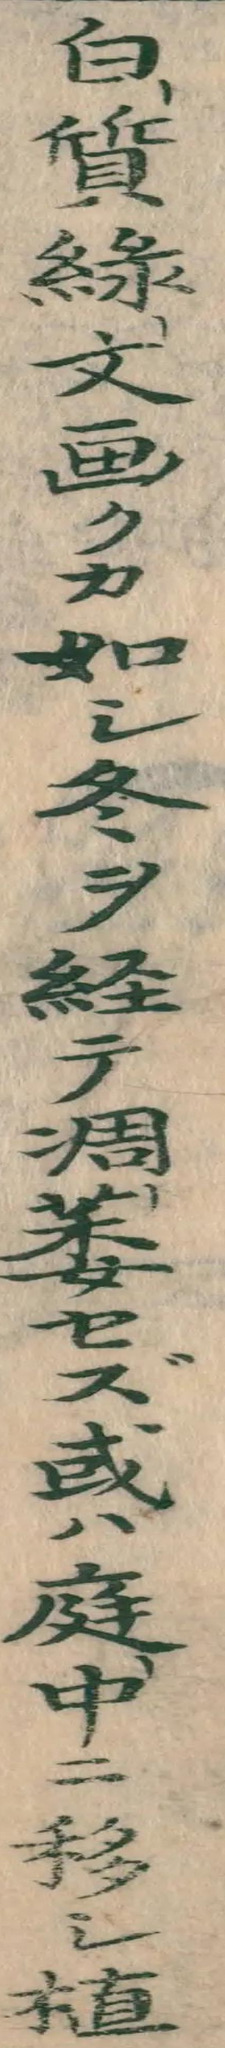白-質緑-文画クカ如シ冬ヲ経テ凋-萎セズ或ハ庭-中ニ移シ植
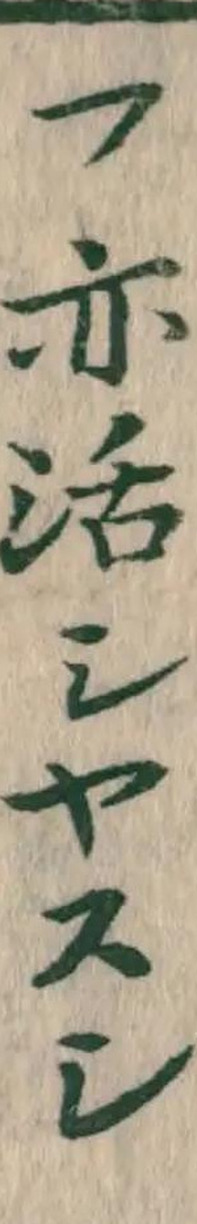フ亦活シヤスシ
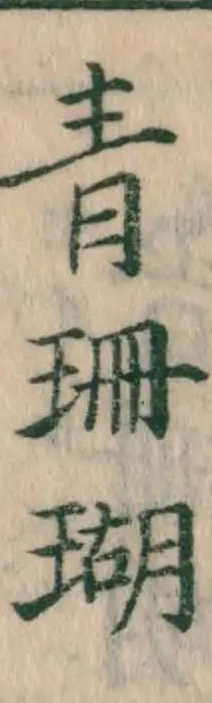青珊瑚

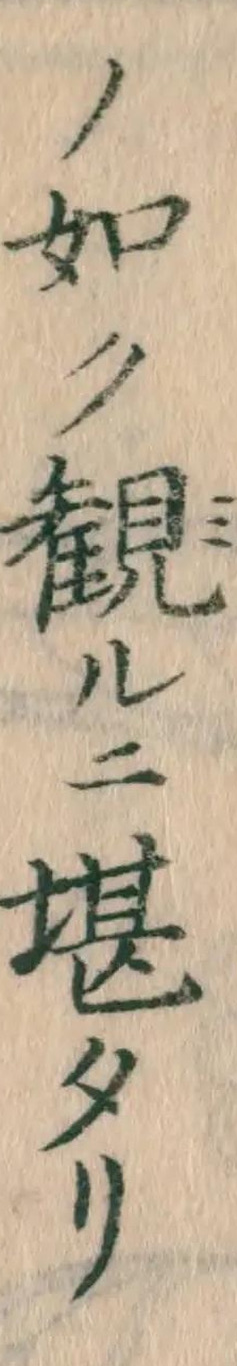ノ如ク観ルニ堪タリ
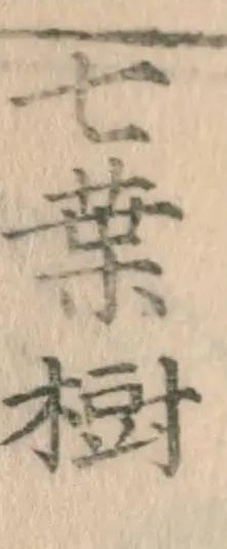七葉樹

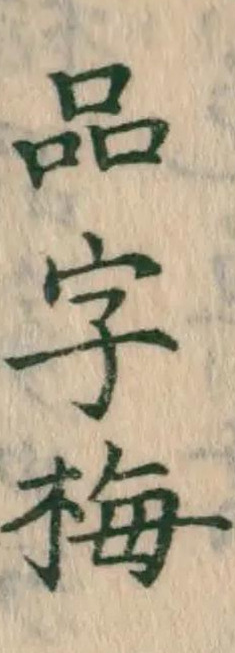品字梅

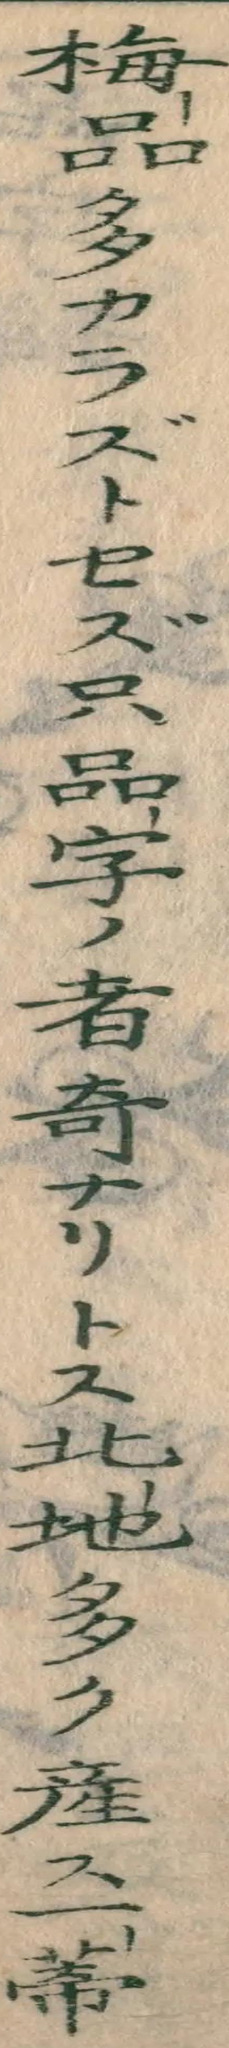梅-品多カラズトセズ只品-字ノ者奇ナリトス北-地多ク産ス一-蒂
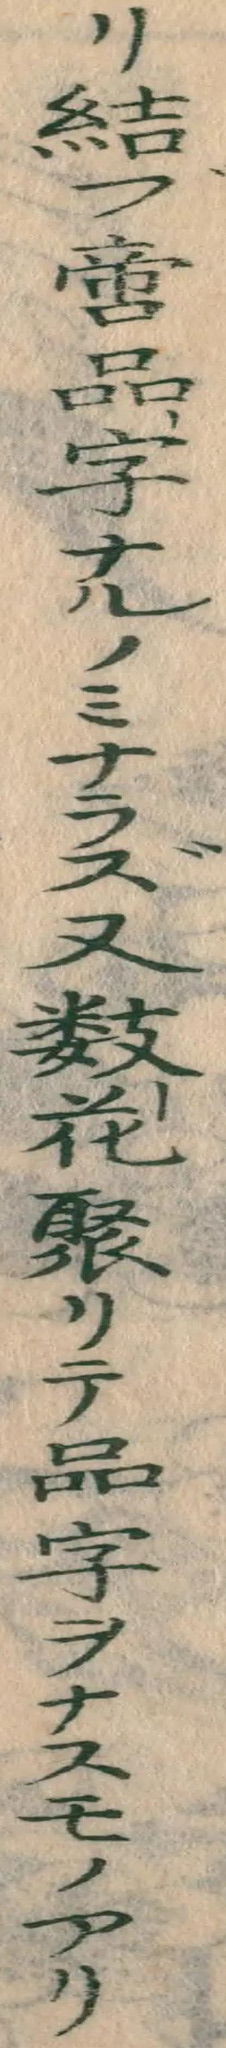リ結ブ啻品-字ナルノミナラズ又数-花聚リテ品字ヲナスモノアリ
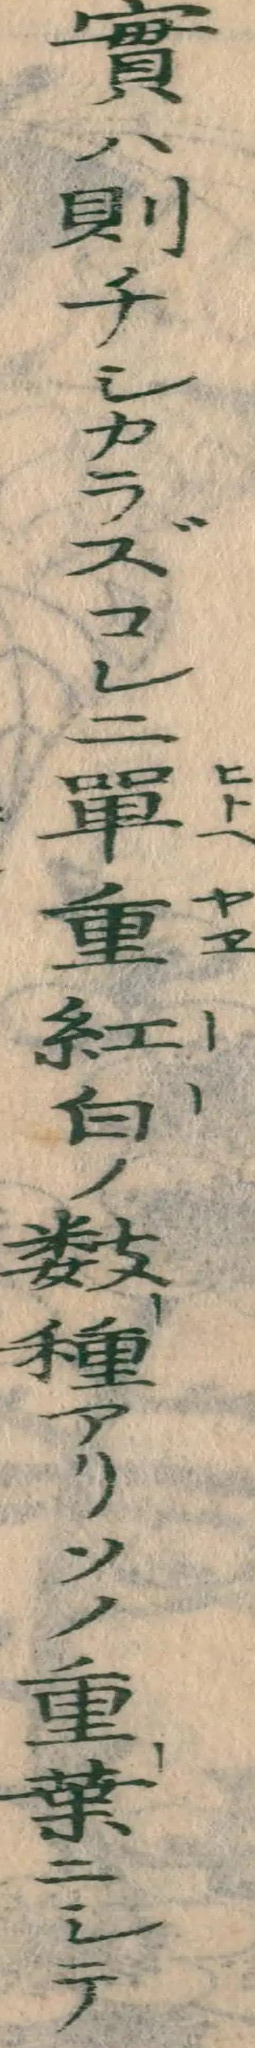実ハ則チシカラズコレニ単重紅白ノ数-種アリソノ重-葉ニシテ
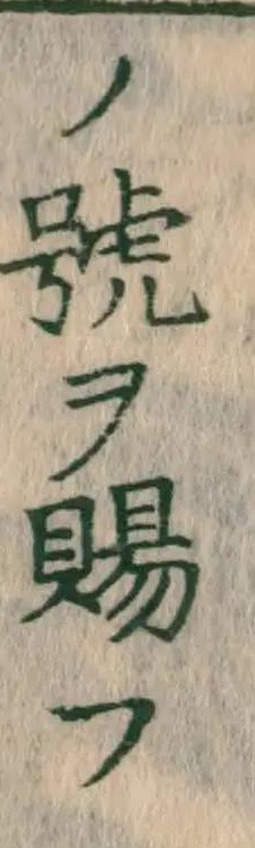ノ号ヲ賜フ
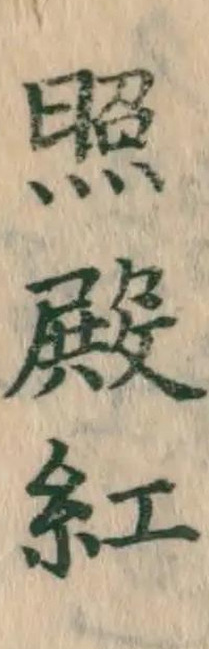照殿紅

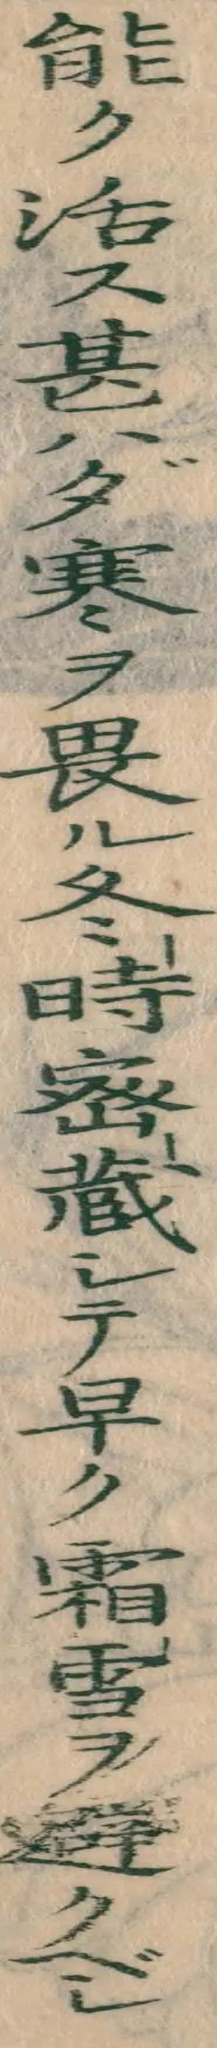能ク活ス甚ハダ寒ヲ畏ル冬-時密-蔵シテ早ク霜-雪ヲ避クベシ

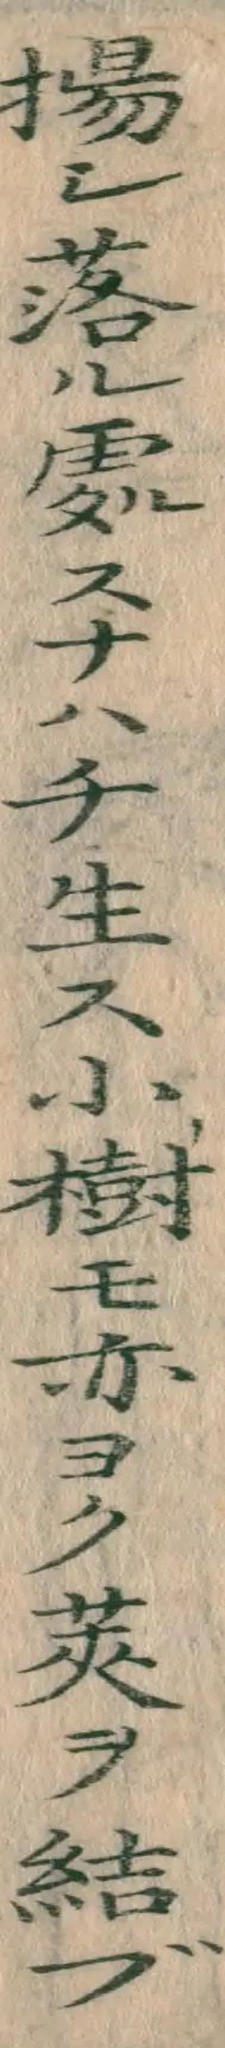揚シ落ル処スナハチ生ス小-樹モ亦ヨク莢ヲ結ブ
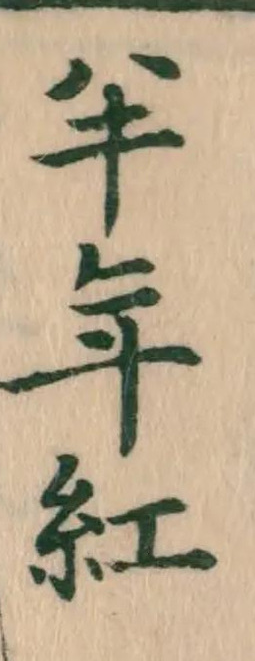半年紅
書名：花彙 草部4巻木部4巻. [2]
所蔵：国立国会図書館 National Diet Library, JAPAN
